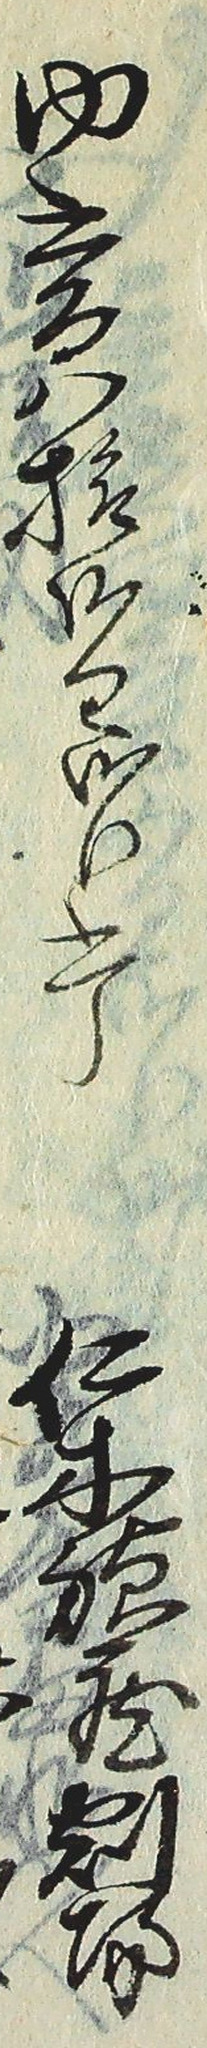内六百八拾弐匁六分仁木徳蔵割場
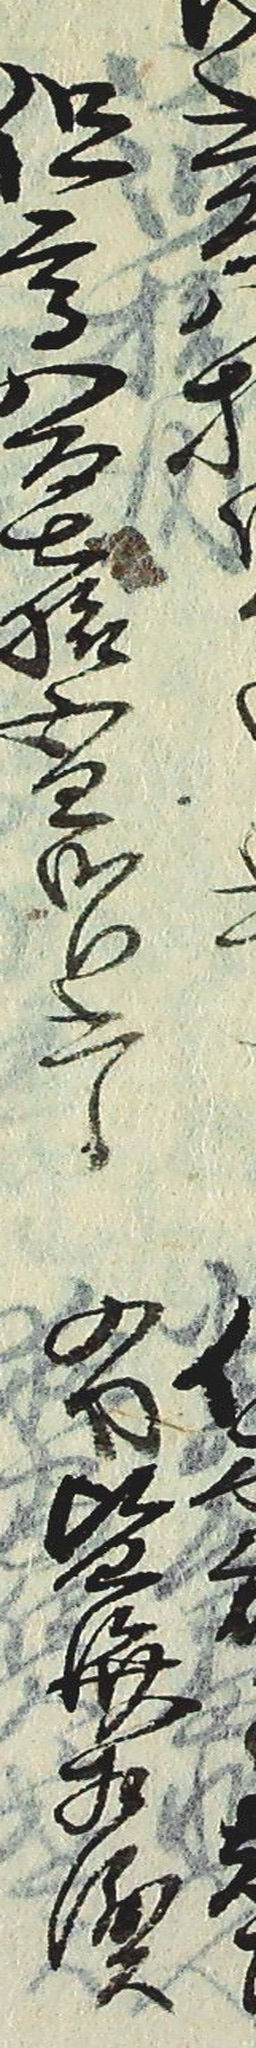但高八百七拾五匁弐分六厘入用皆済相渡す
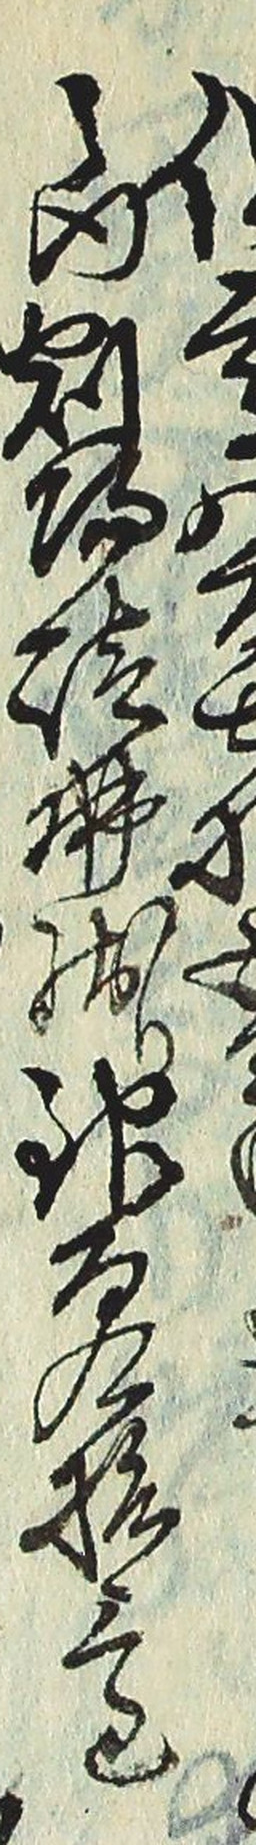之内割場請払残り銀百九拾三匁
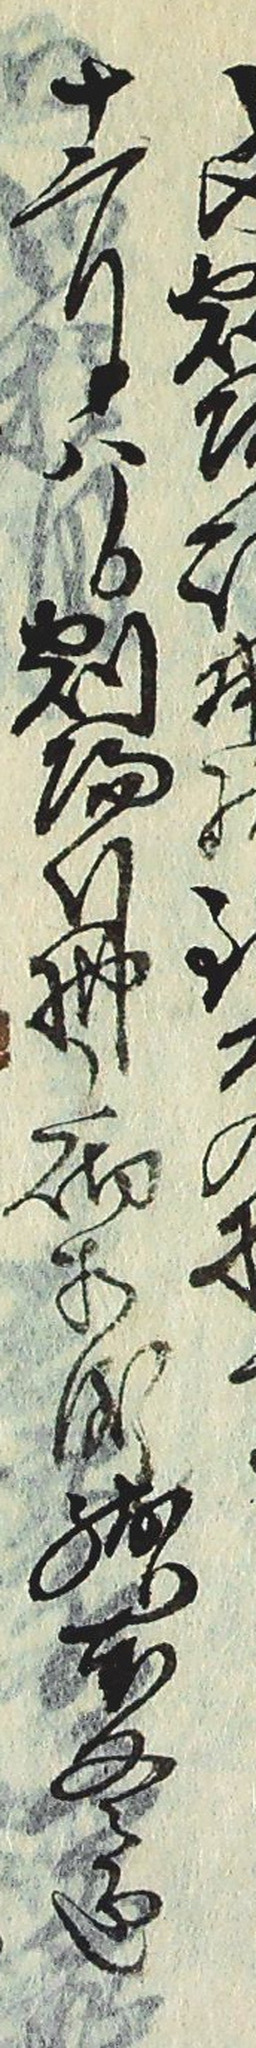十二月十八日割場引払之砌相渡残り本文之通
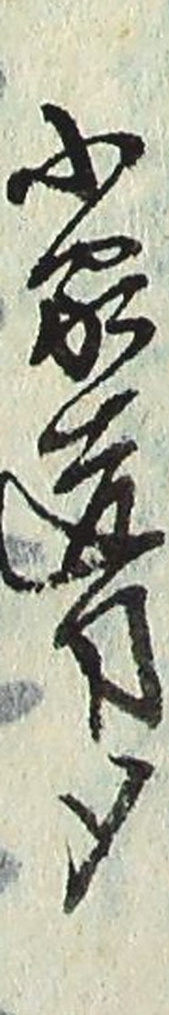小家造用〆
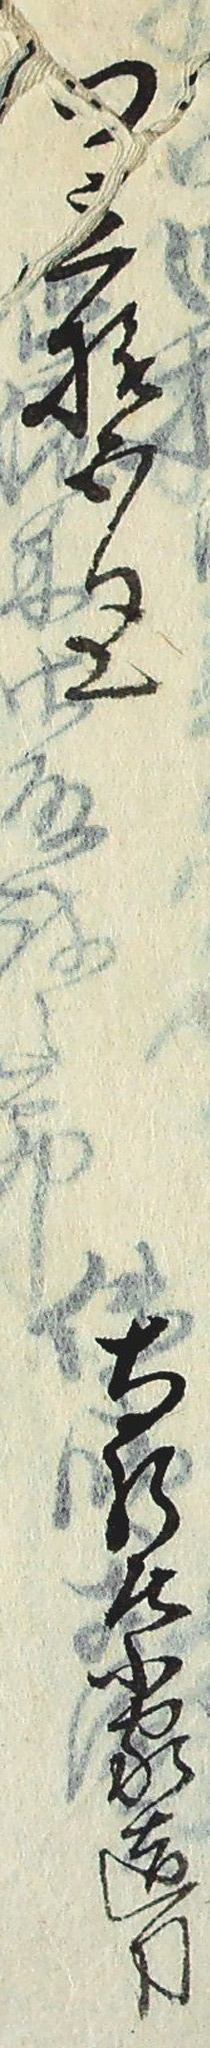同三拾五匁南新居小家造用

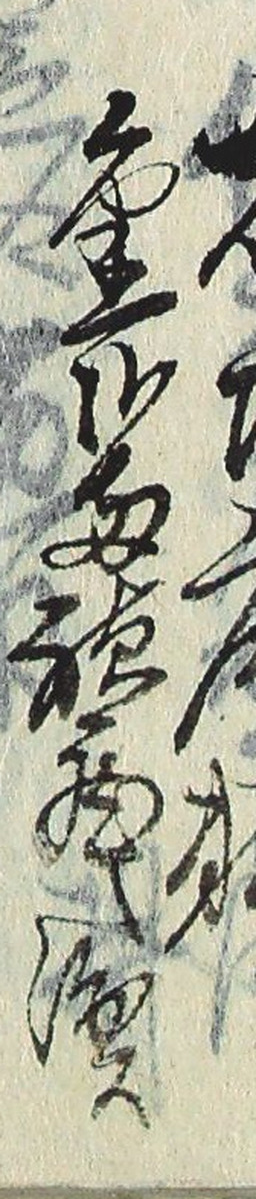金弐両禎蔵へ渡す
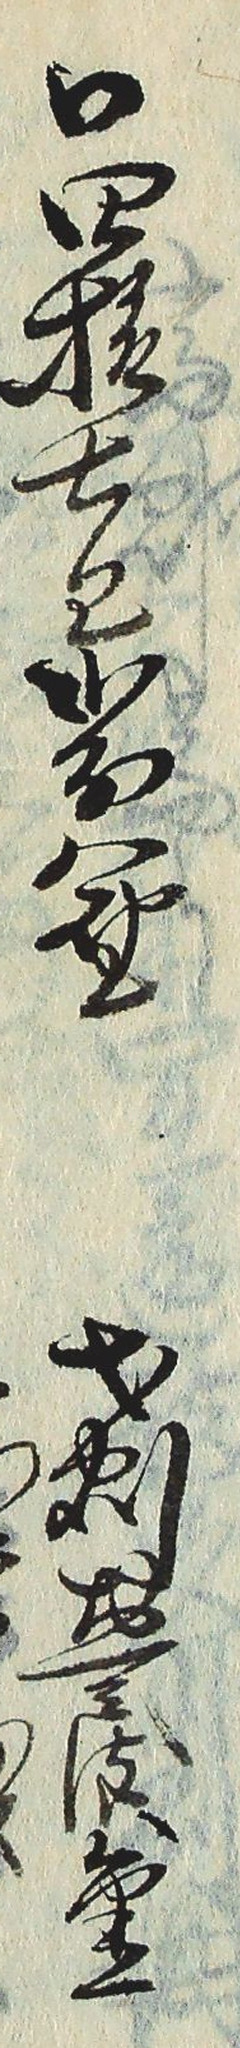同四拾七匁弐分八厘才判惣兵衛へ金
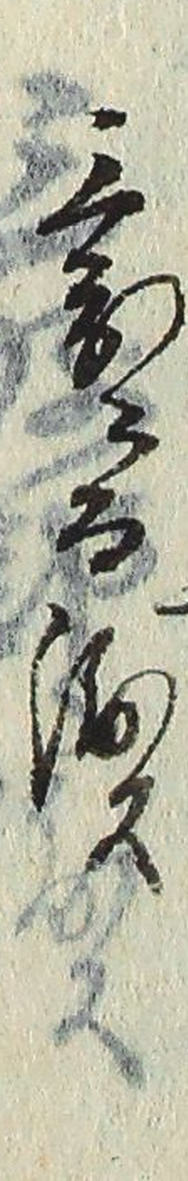三歩にて渡す
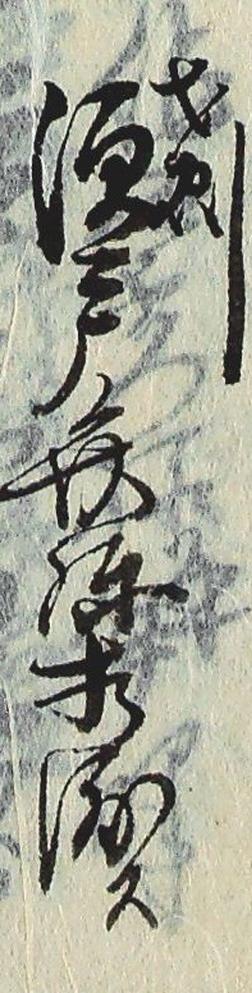須戸弁弥相渡す
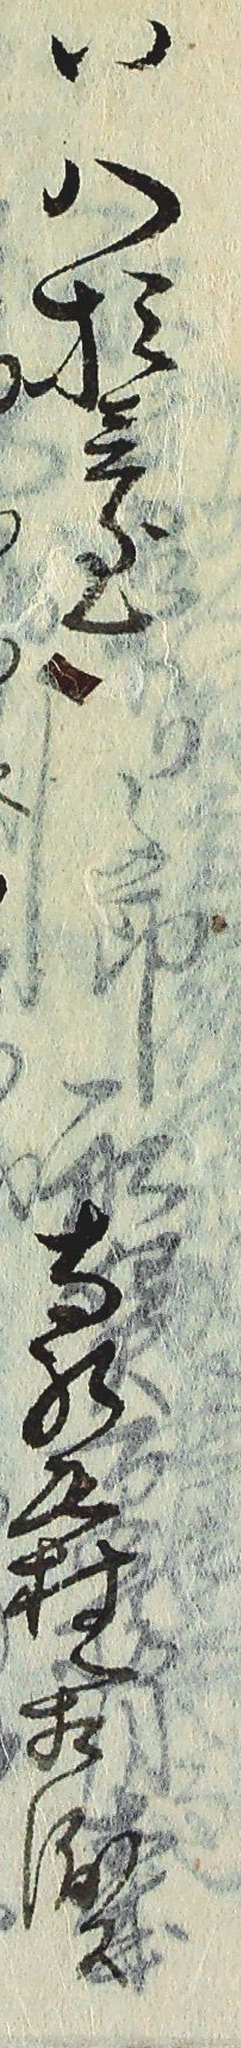同八拾壱匁南新居村へ相渡す
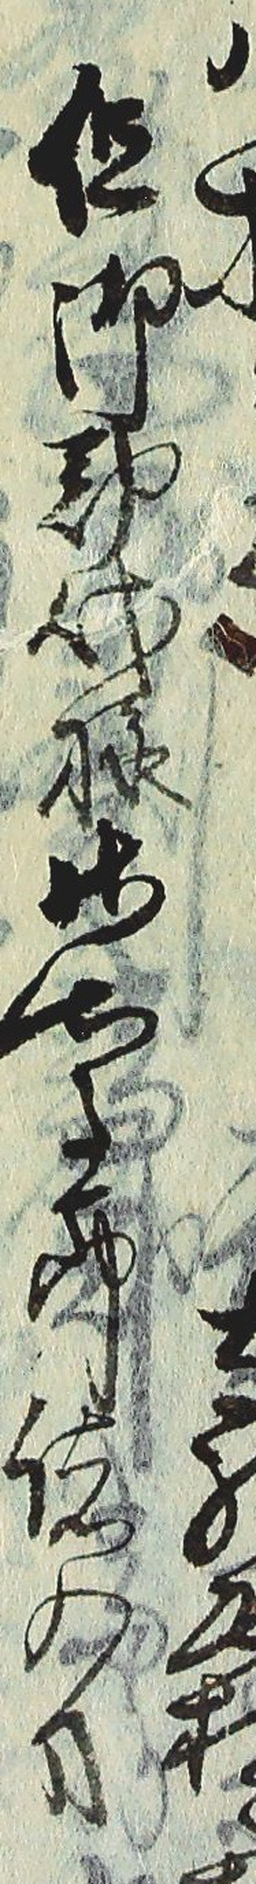但御郡代様御出之節諸入用
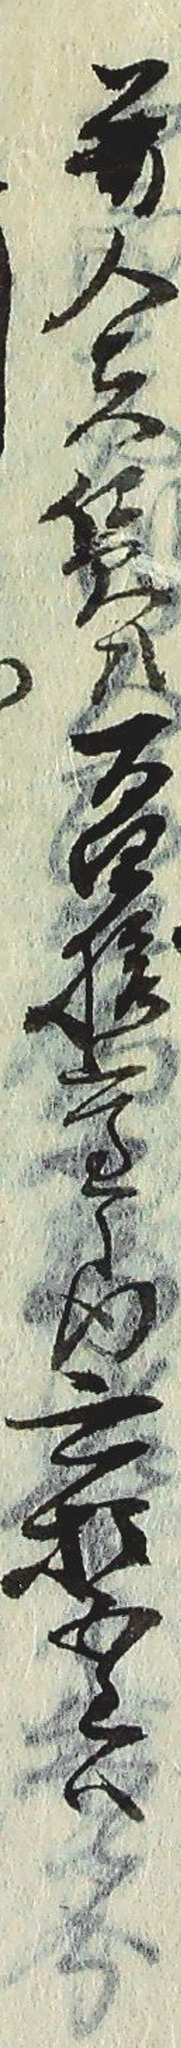并人夫賃共百拾六匁之内六拾五匁は
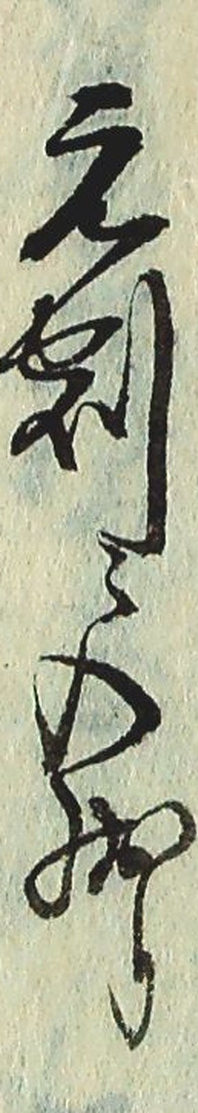元割に入残り
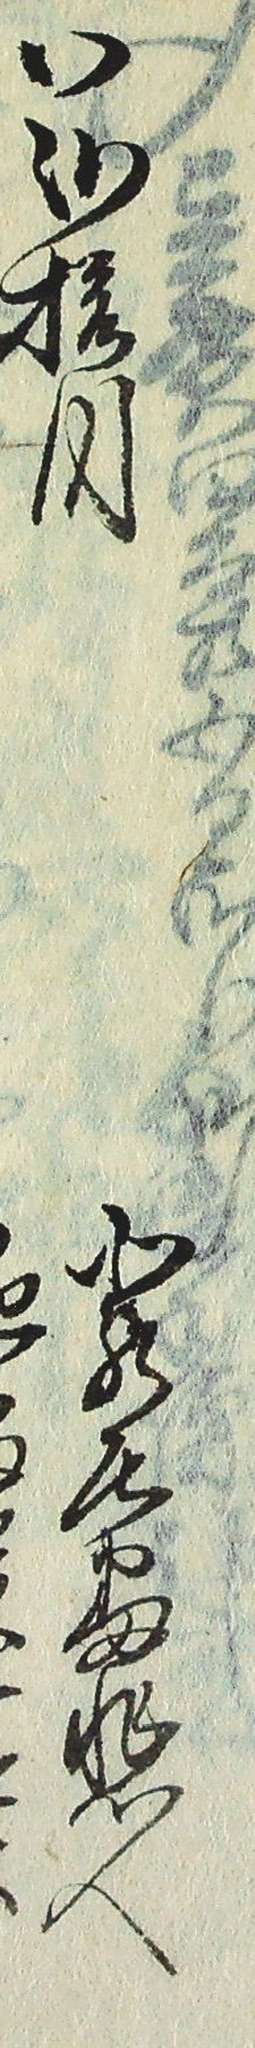同弐拾目北新居番悲人
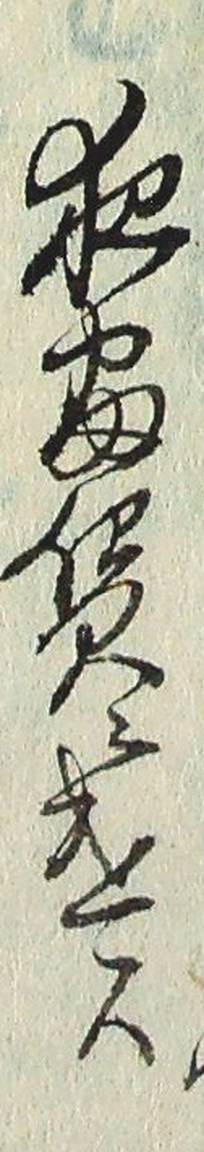夜番賃に遣す
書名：名東郡中諸割賦元帳
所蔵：鳴門教育大学 Naruto University of Education
